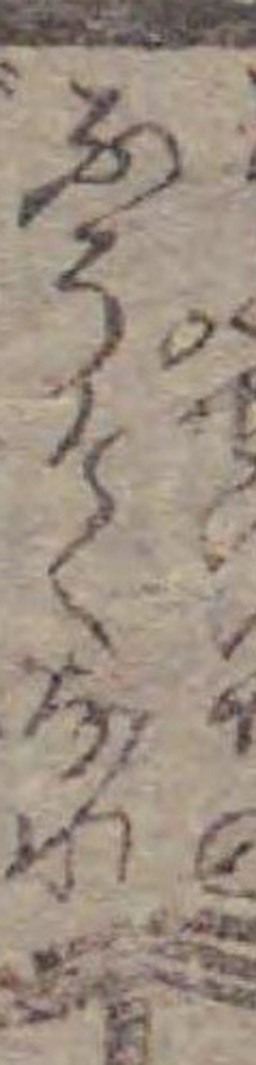ふうそくなれ
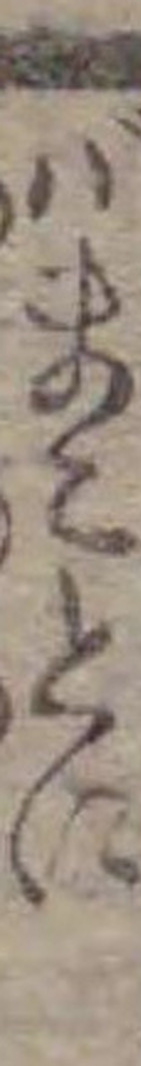ばまことに
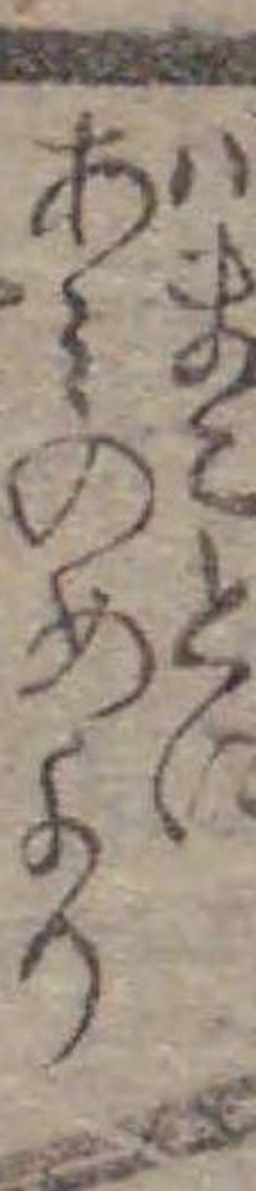あみのめより
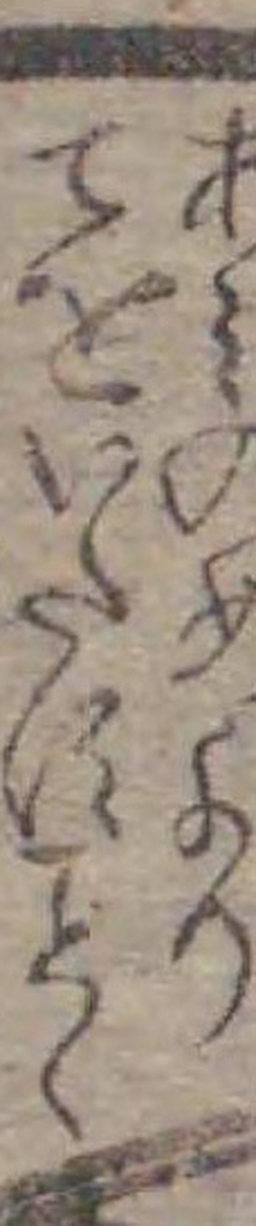てをいたすことく
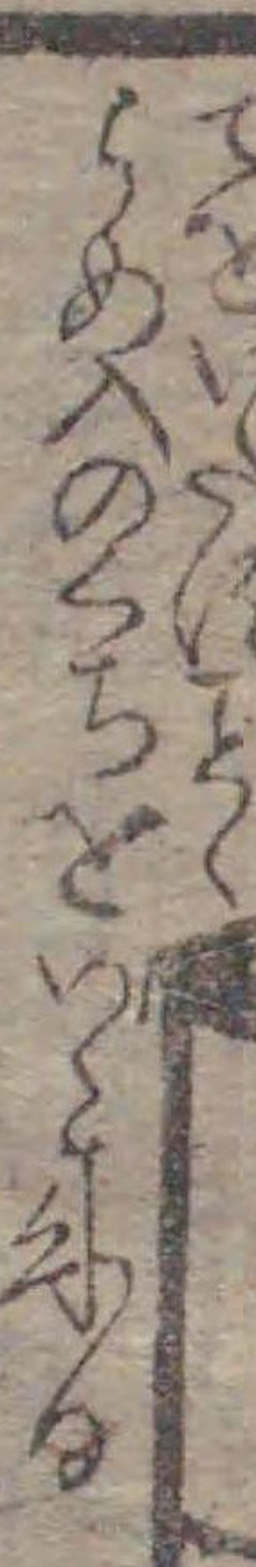よめ入りのくちをいゝ来る
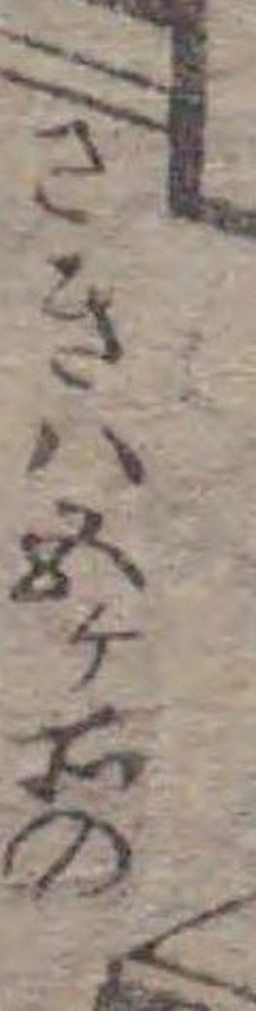さきは五ヶ所の
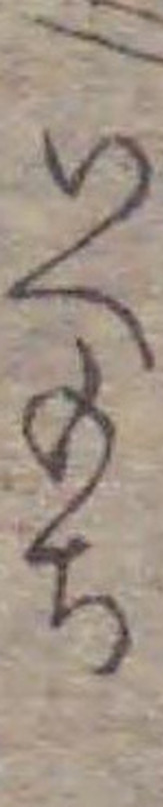いへもち
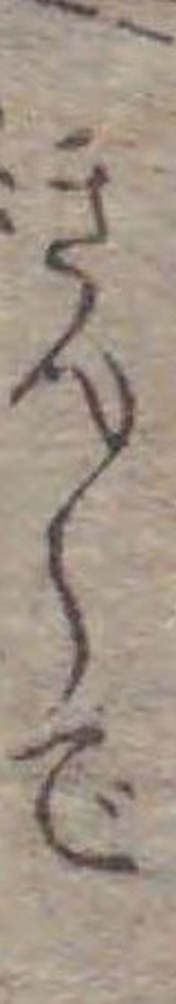きん〳〵で
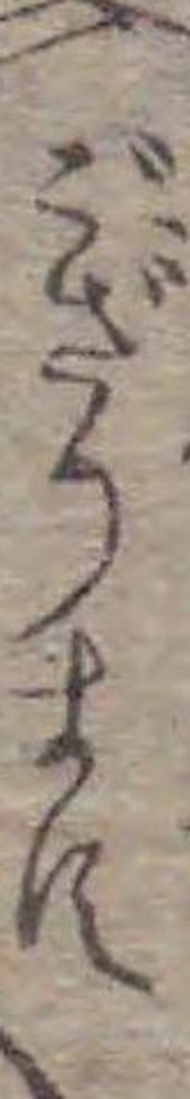ござります
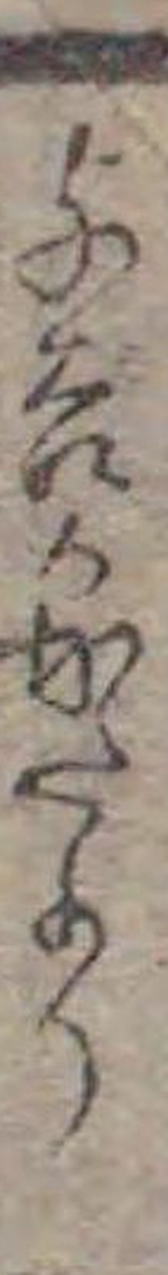与吉かかたより
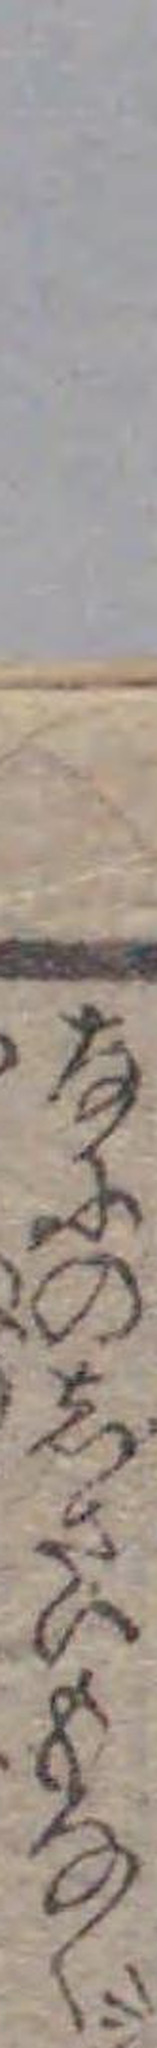なにのしさいもなく
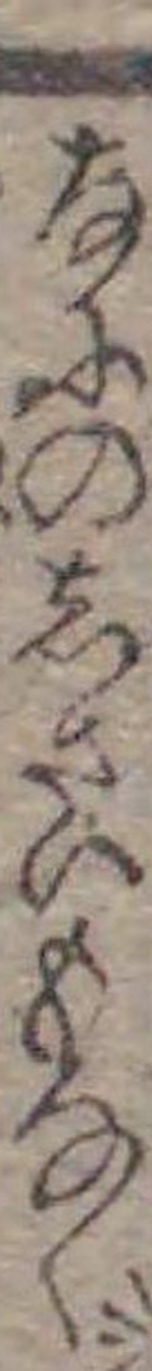なにのしさいもなく
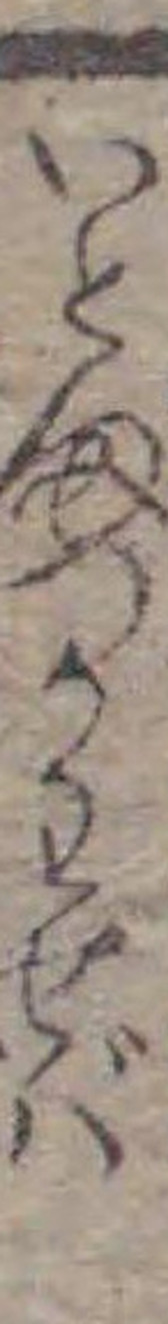いとまつかわせば
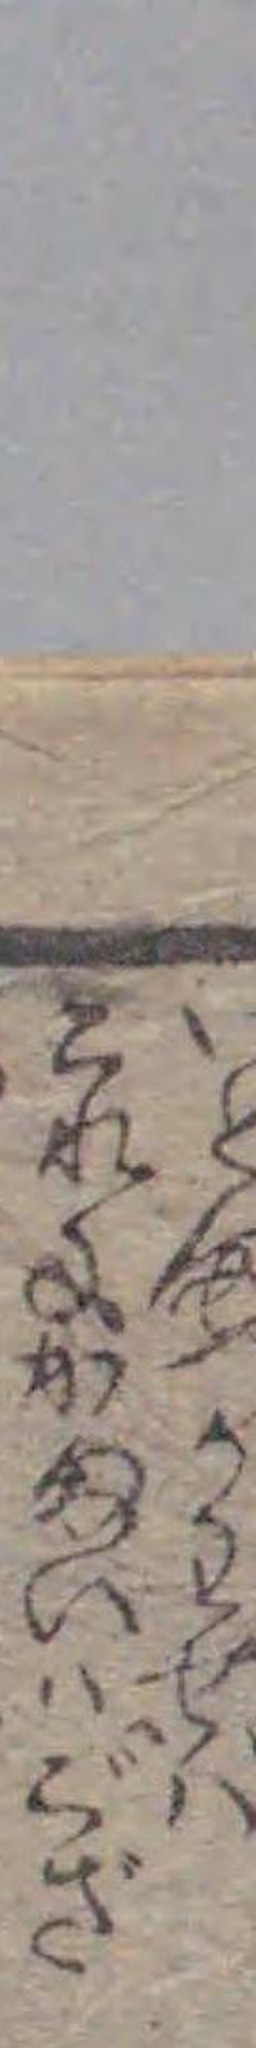これにかまいはござ
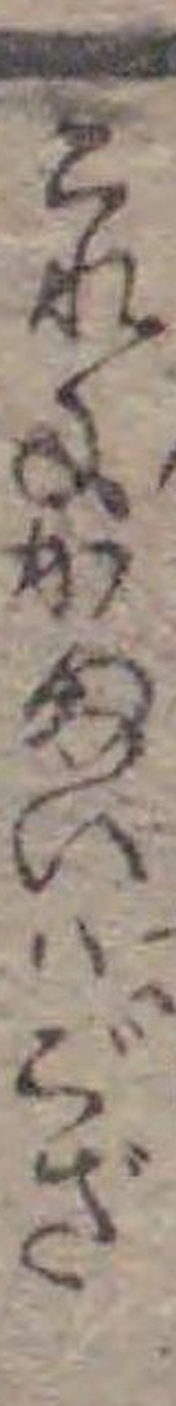これにかまいはござ
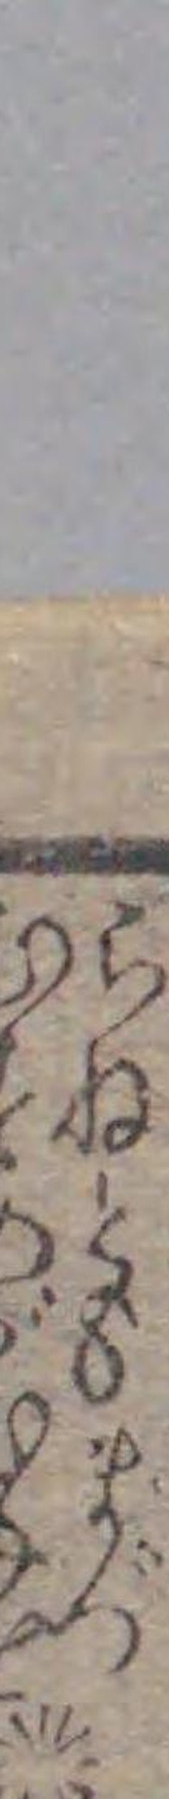らねともまづ
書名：神田与吉一代記 : 3巻
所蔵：国立国会図書館 National Diet Library, JAPAN
